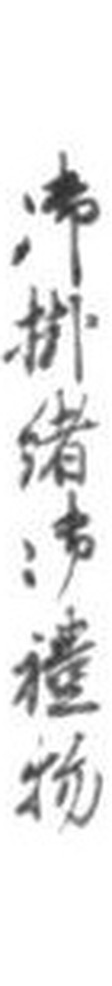御掛緒御礼物
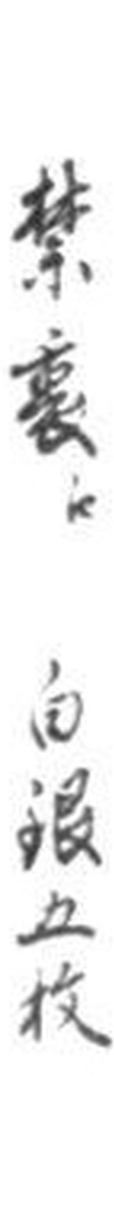禁裏江白銀五枚
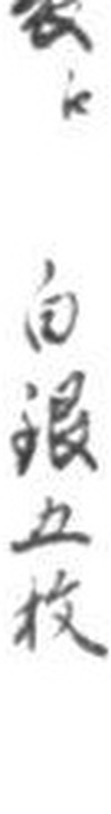白銀二枚
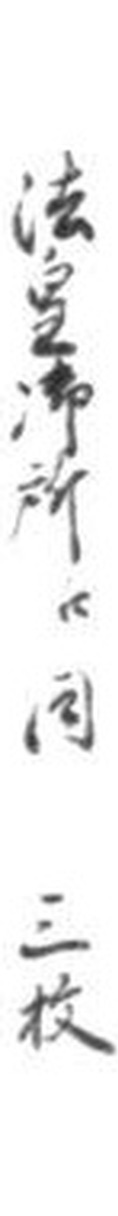法皇御所江同三枚
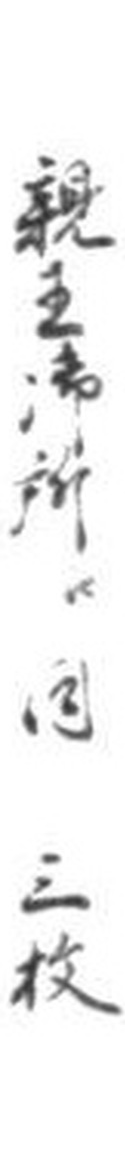親王御所江同三枚
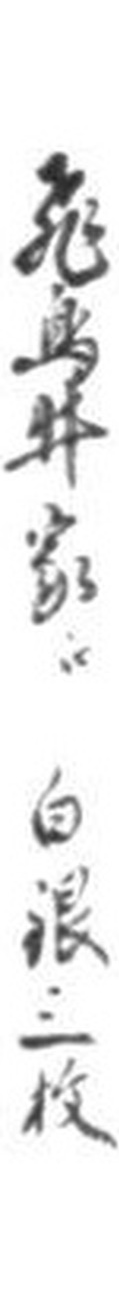飛鳥井家江白銀三枚
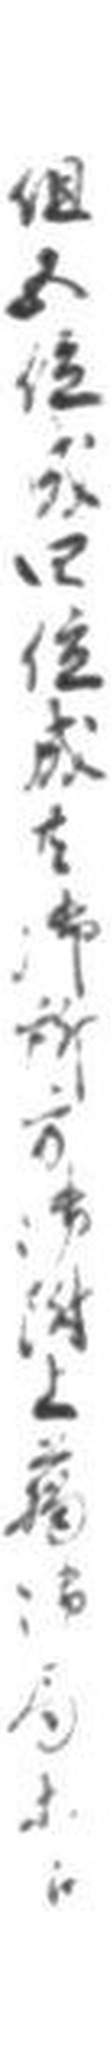但五位成四位成共御所方御附上臈御局等江
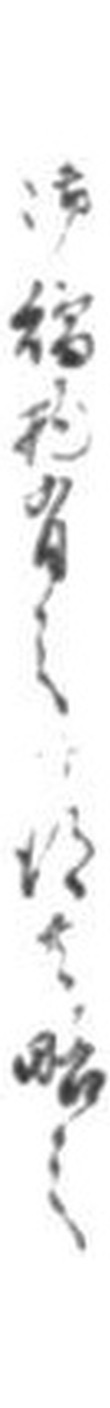御縮物有之候得共略之
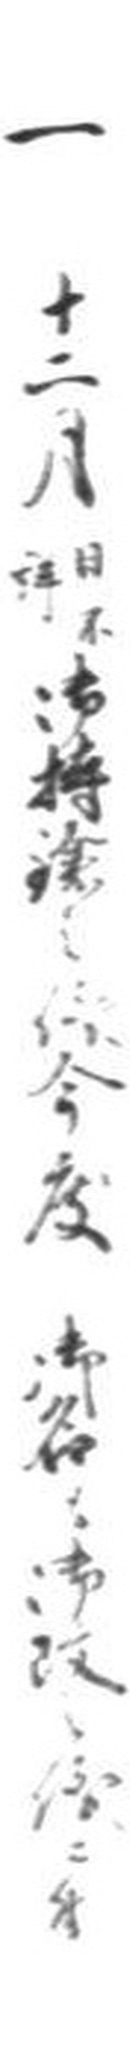一十二月日不詳御持鎗之儀今度御名も御改之儀ニ付
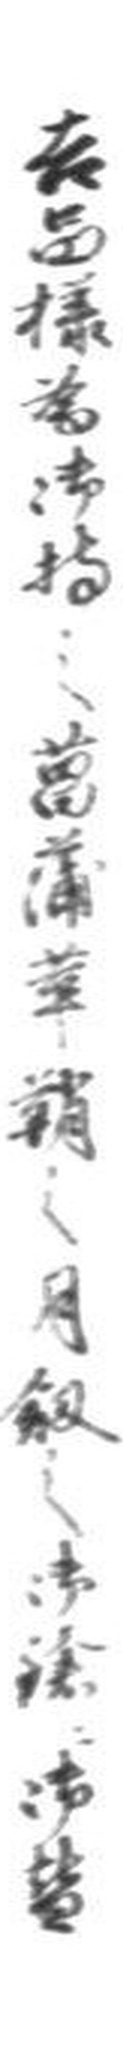吉品様為御持之菖蒲葦鞘之月劔之御鎗ニ御替
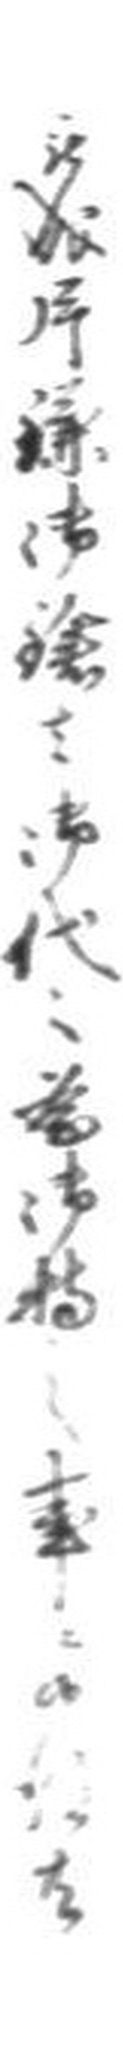被成片鎌御鎗者御代々為御持之事ニ候得共
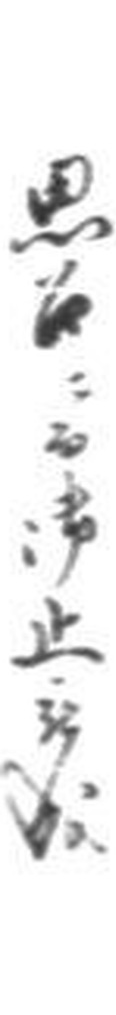思召ニ而御止被成
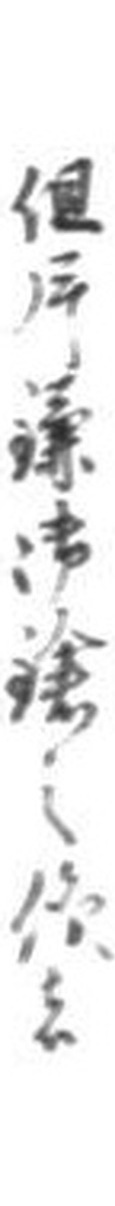但片鎌御鎗之儀者
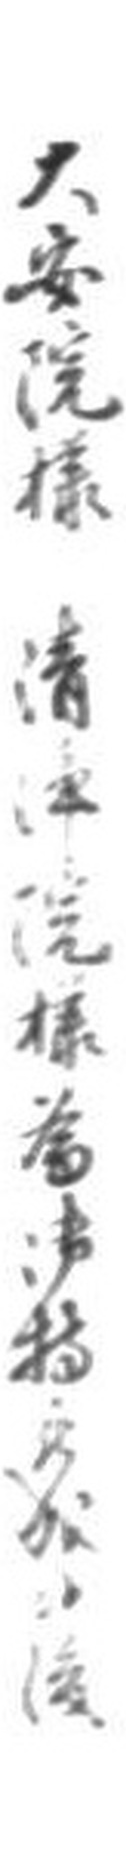大安院様清浄院様為御持被成候後
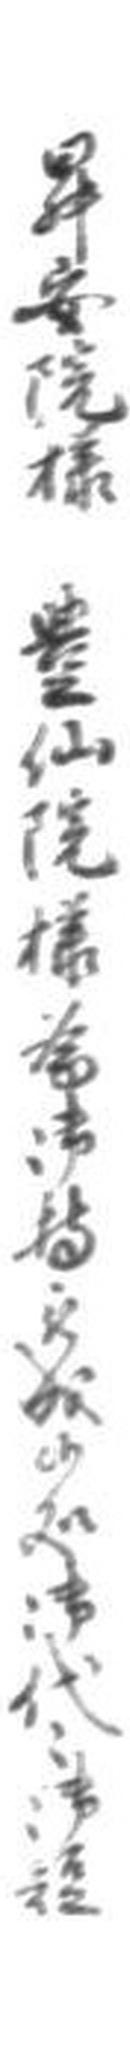昇安院様豊仙院様為御持被成候処御代々御短
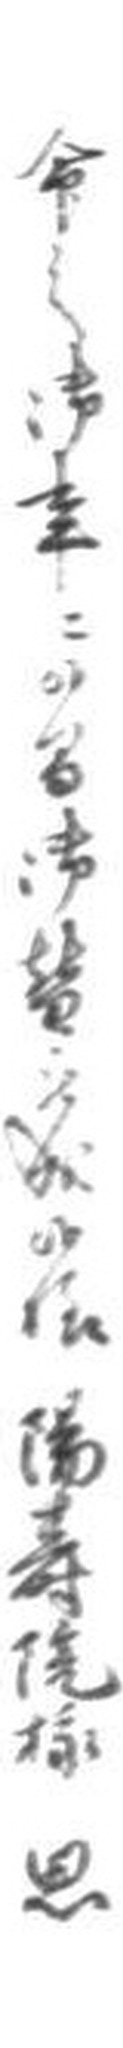命之御事ニ候間御替被成候様陽寿院様思
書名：家譜 四十 宗矩公 従享保十一年到享保十二年
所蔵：福井県文書館 Fukui Prefectural Archives
